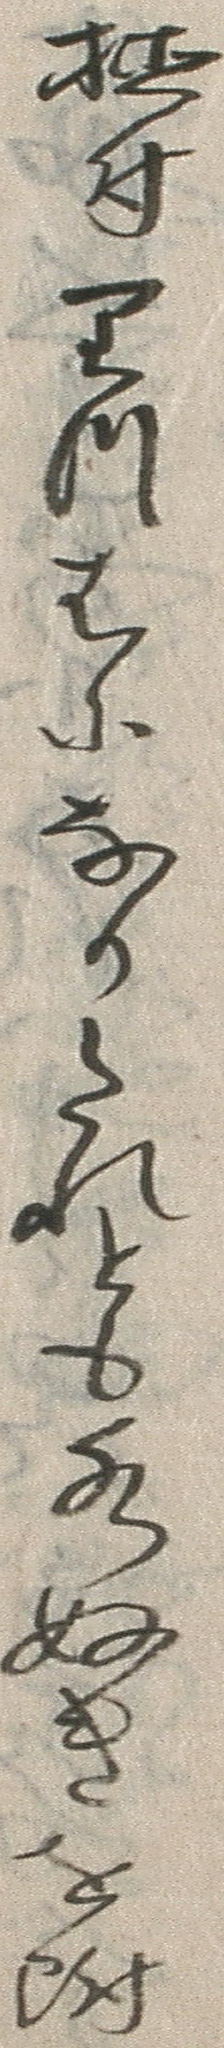植付りつはになりたれとも水ぬきを附
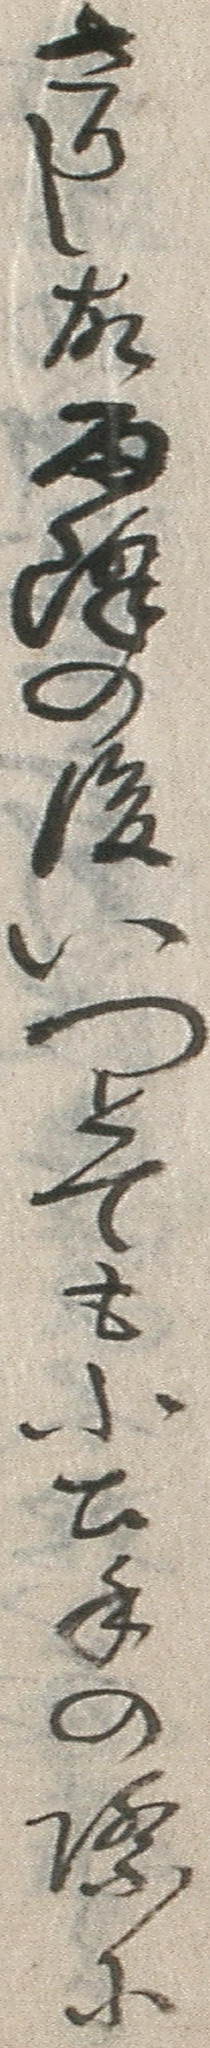さりし故雨降の後いつとても小土手の際に
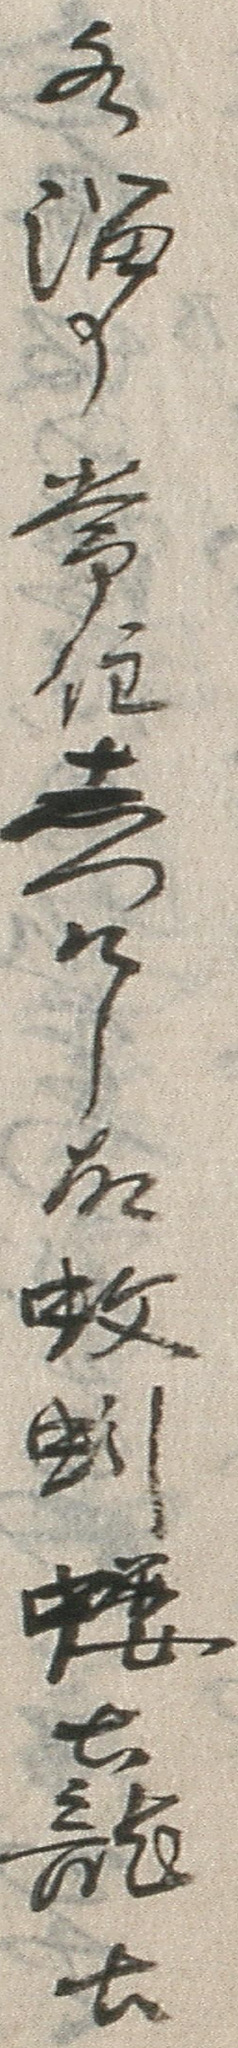水溜り常住しつけし故蚊蚓螻土龍土
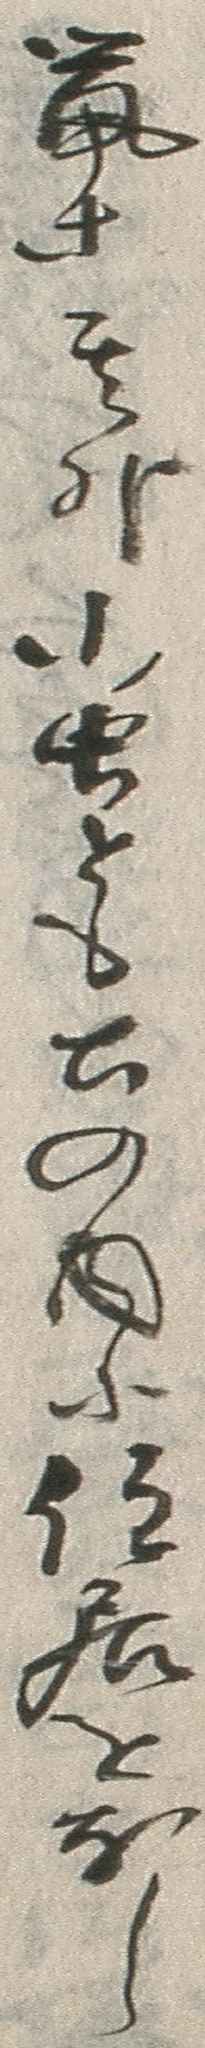鼠等其外小虫とも土の内に住居をなし
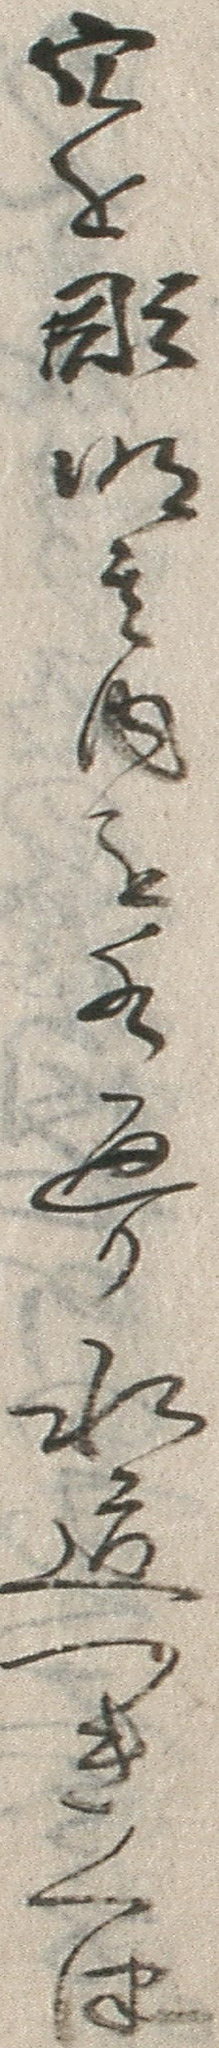穴を彫明其内を水通り水道つきくつ
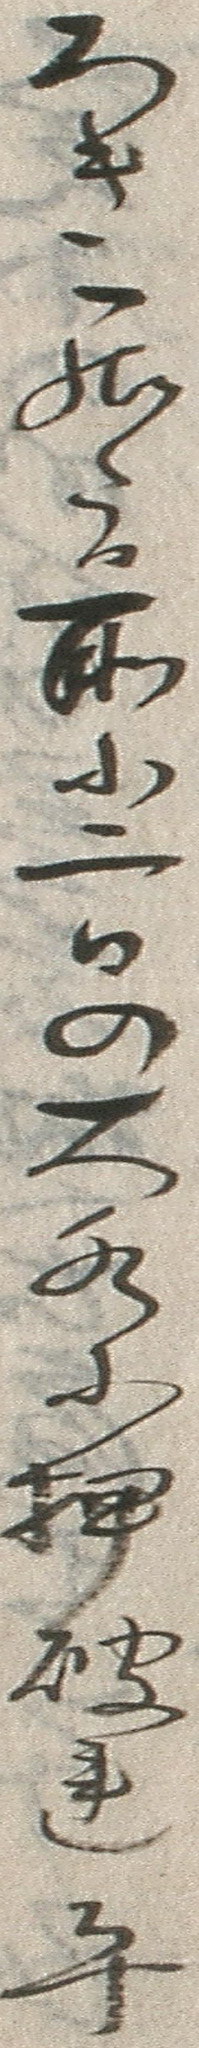ろき居たる所に二日の大水に押破れ平
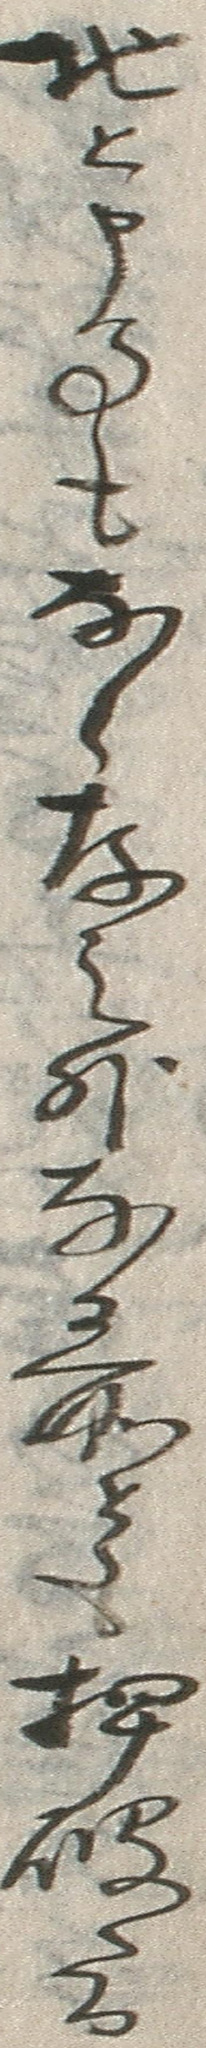地と申事もなく存之外なる所とも押破たる
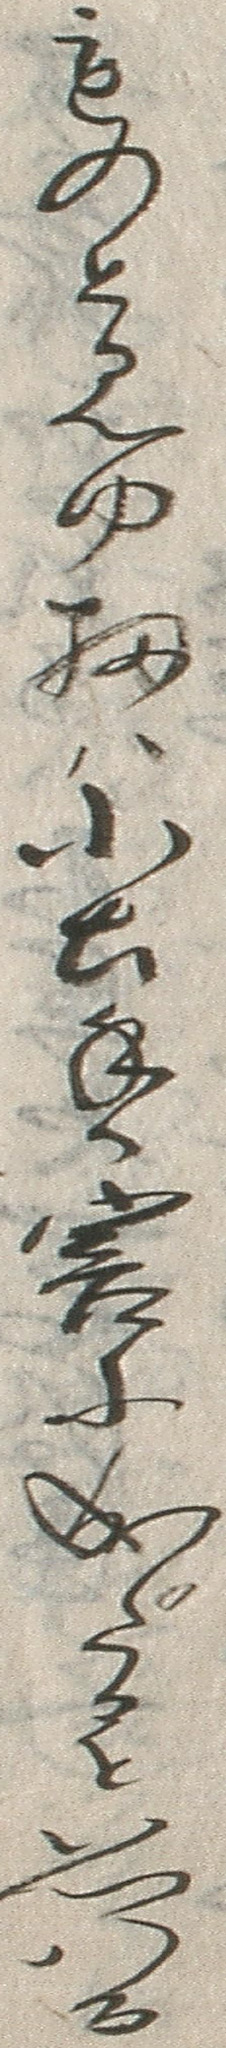ものと見ゆ扨は小土手か害に成だると思はる
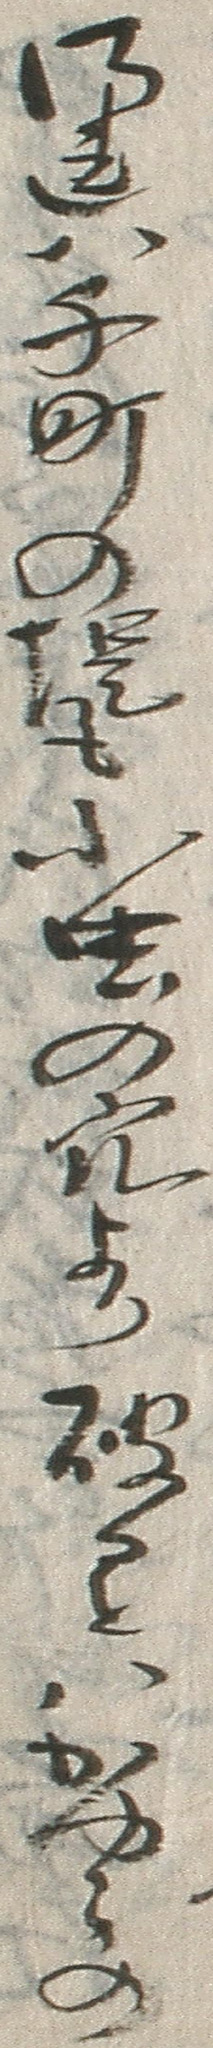されは千町の堤も小虫の穴より破るとはかやうの
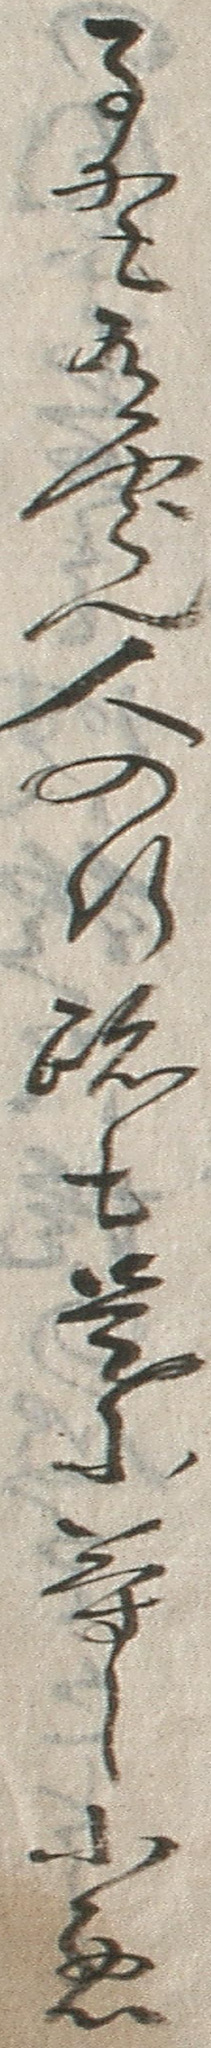事にも有やらん人の行跡も是に等し小悪

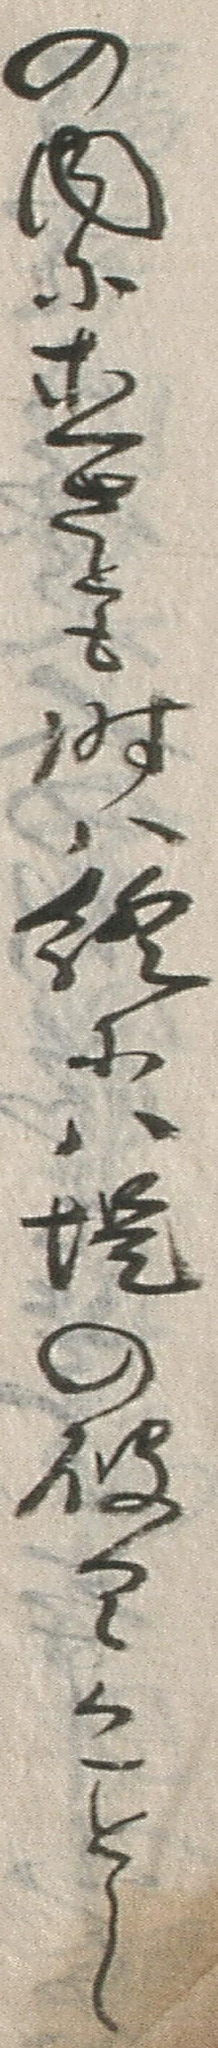の内に直さとも時は終には堤の破るゝことし
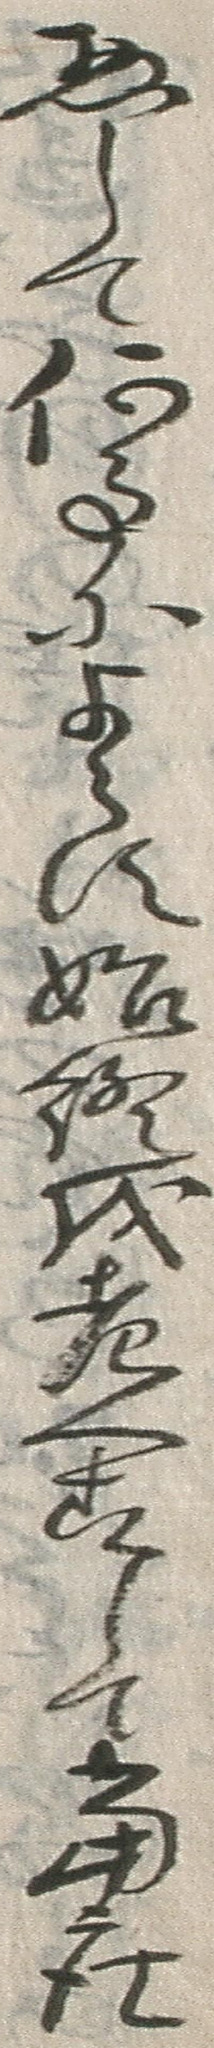惣して何事によらす始終を考へすして当座
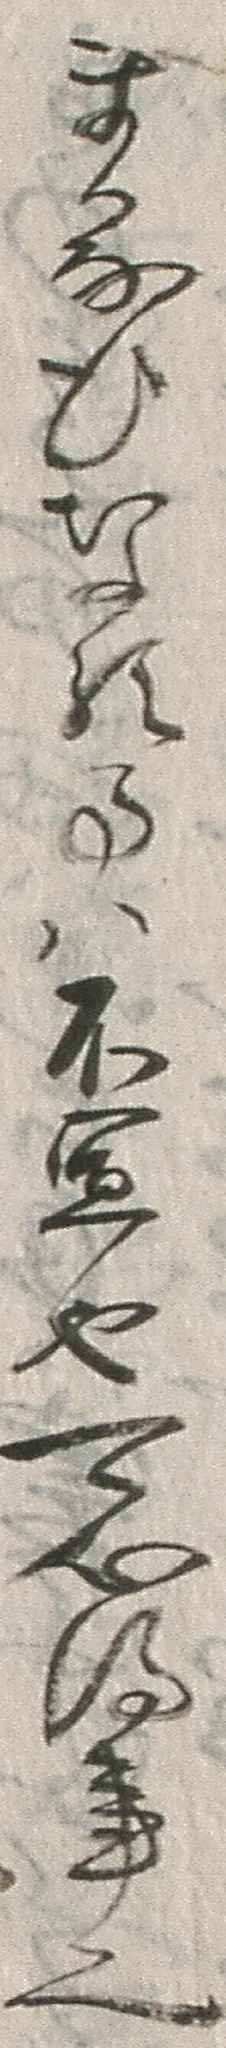まかなひなす事は不宜や可心得事也
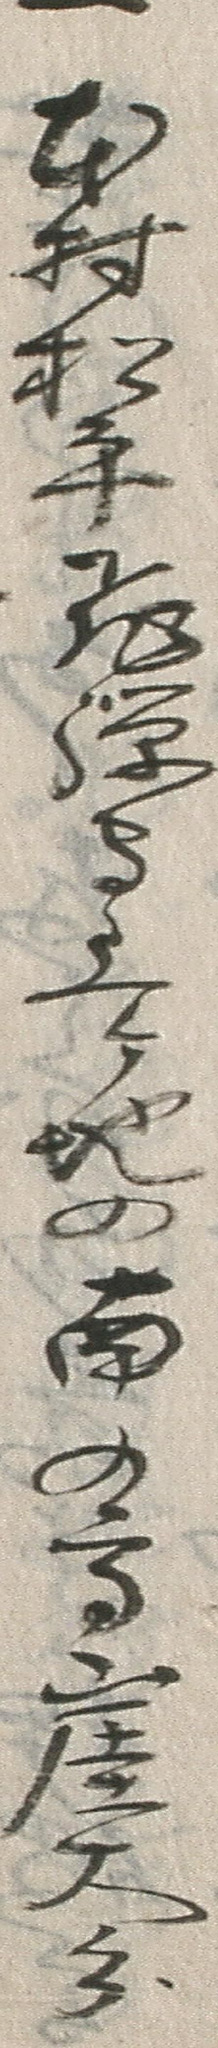一本村松平飛騨守上ケ地の南の方崖大分
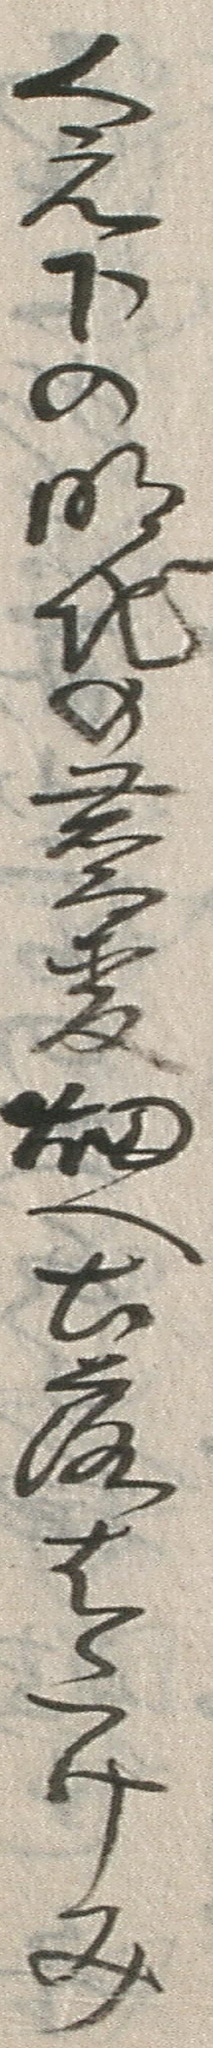くえ下の明地の蕎麦畑へ土落はたけみ
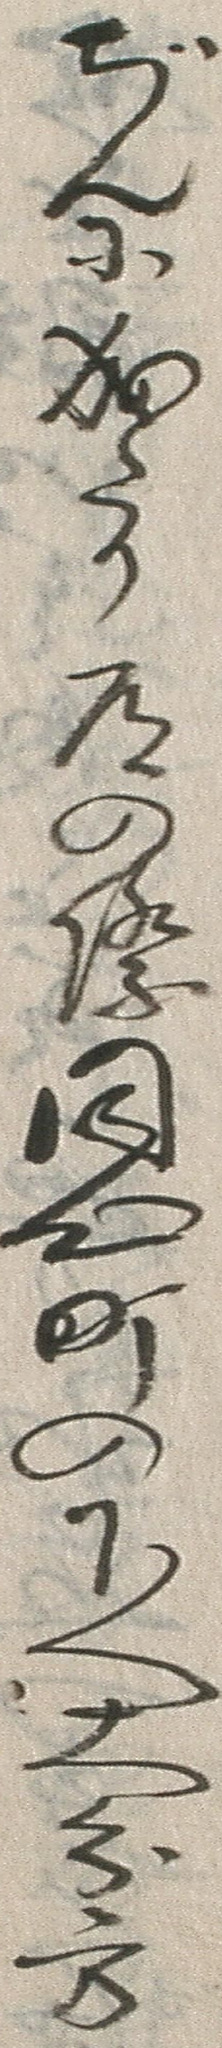ぢんに成たり道の際同心町の下へ大分方
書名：享保十三年江戸洪水記
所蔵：東京大学地震研究所図書室 Earthquake Research Institute Library, The University of Tokyo, JAPAN
